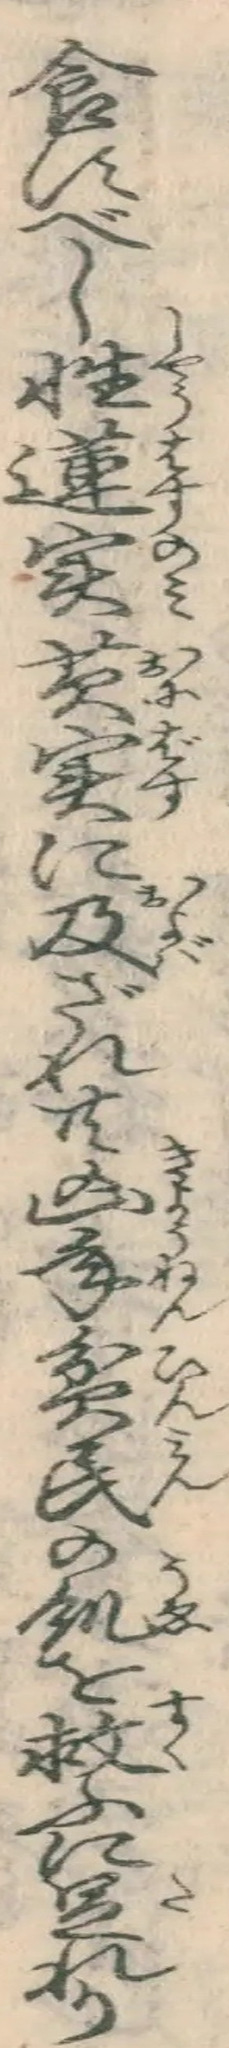食すべし性蓮実黄実に及ざれ共凶年貧民の飢を救ふに足れり
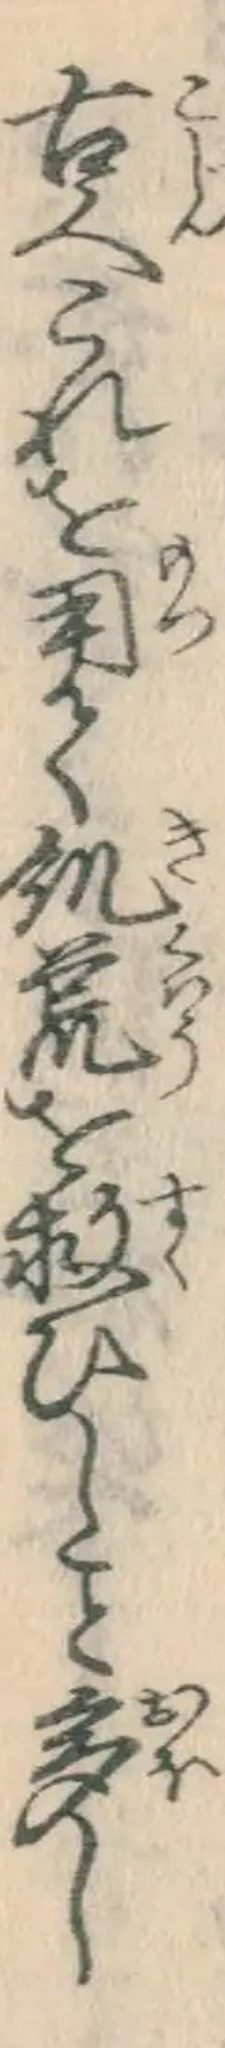古人これを用て飢荒を救ひしこと多し
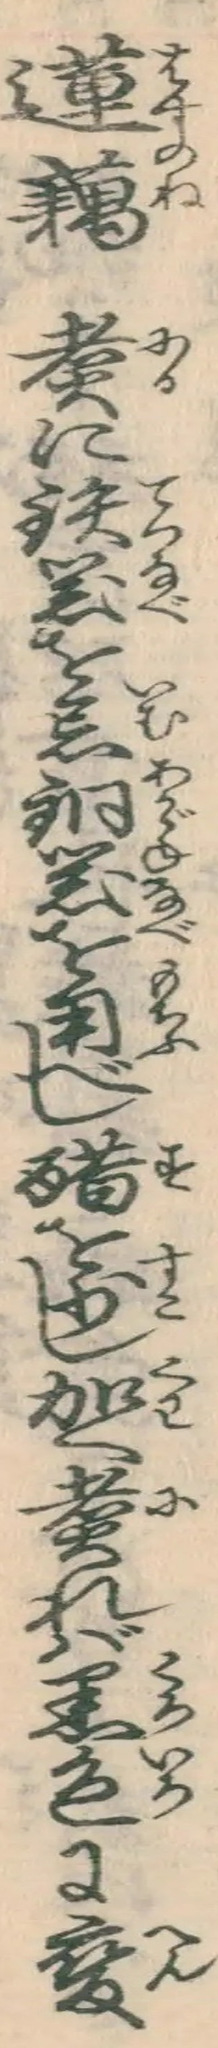蓮藕煑に鉄器を忌銅器を用べし醋を少し加へ煑れば黒色に変
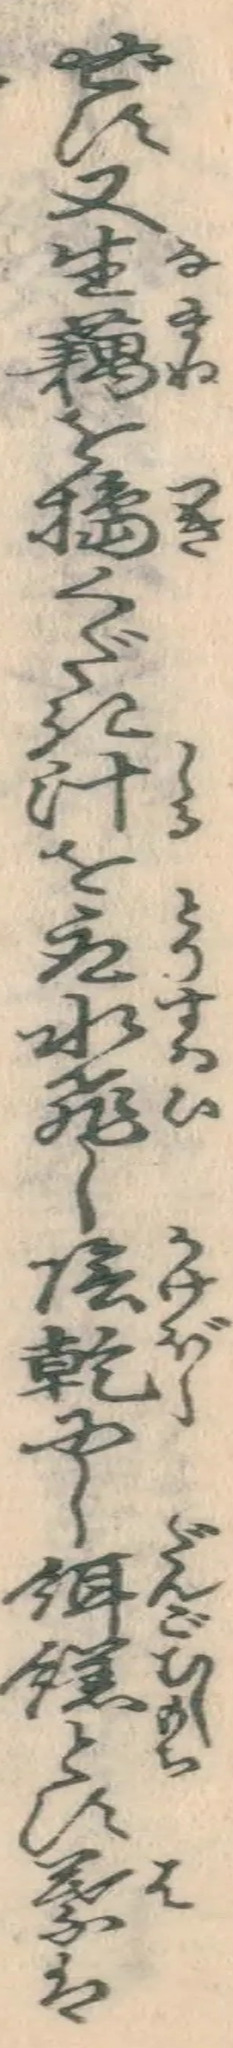ぜす又生藉を搗くだき汁を取水飛し陰乾にし餌餻とす葉は
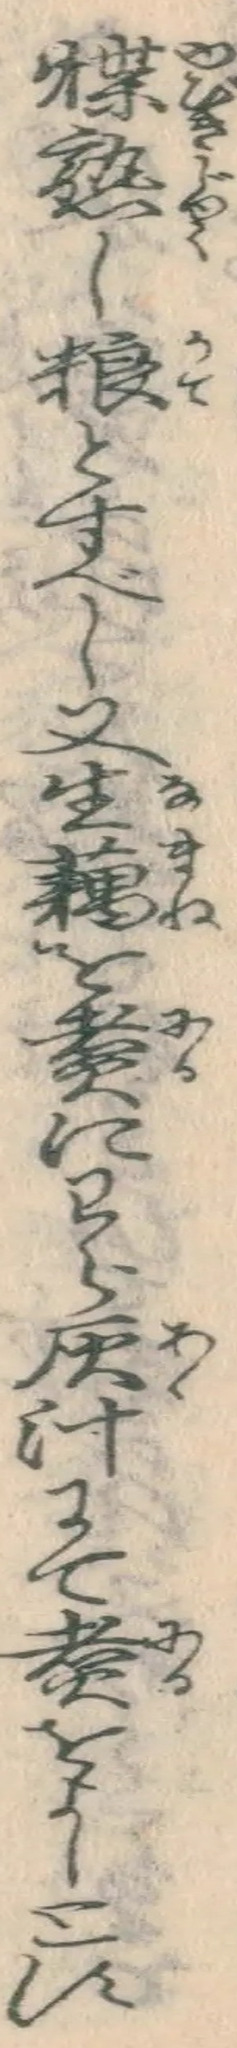煠熟し粮とすべし又生藕を煑にわら灰汁にて煑をよしとす
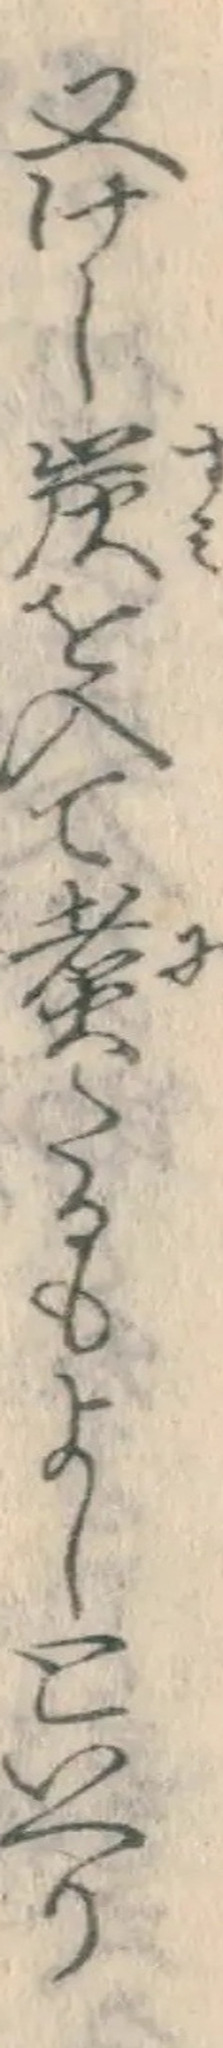又けし炭を入て煑たるもよしといへり
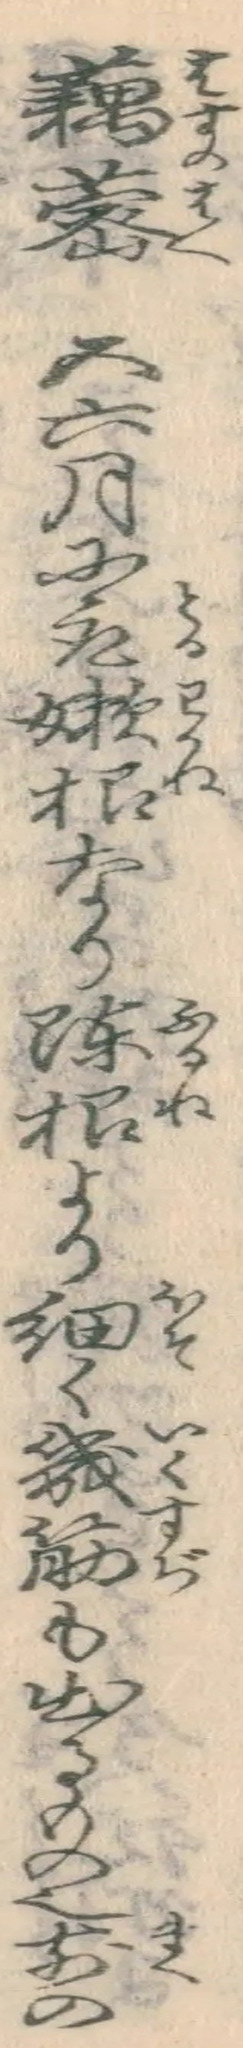藕蔤五六月に取嫰根なり陳根より細く幾筋も出るもの也前の
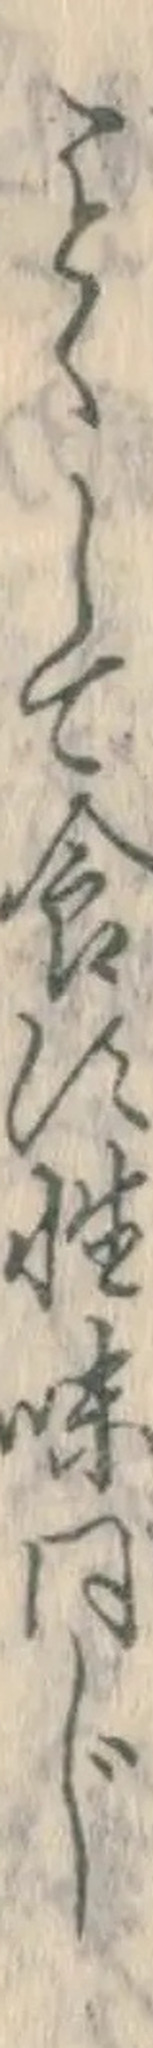ごとくして食す性味同じ
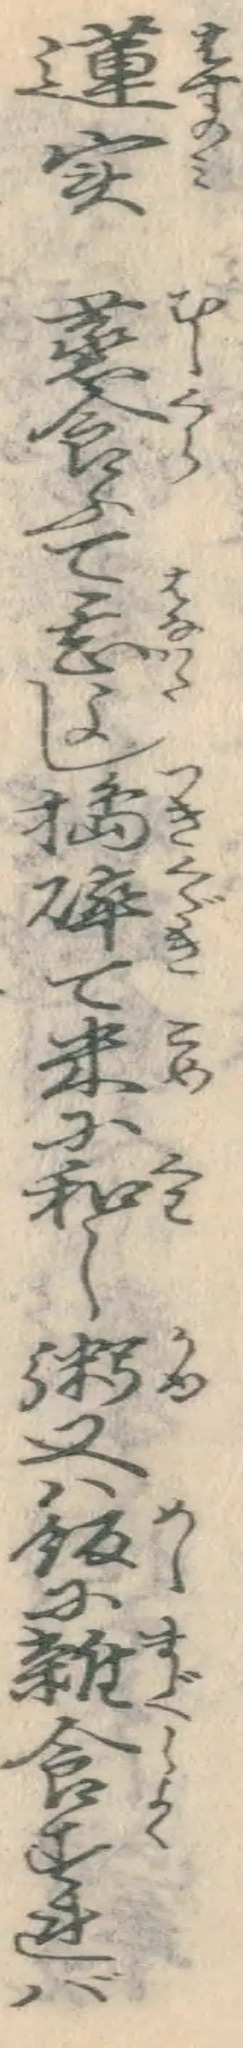蓮実蒸食ふて甚よし搗砕て米に和し粥又は飯に雑食すれば
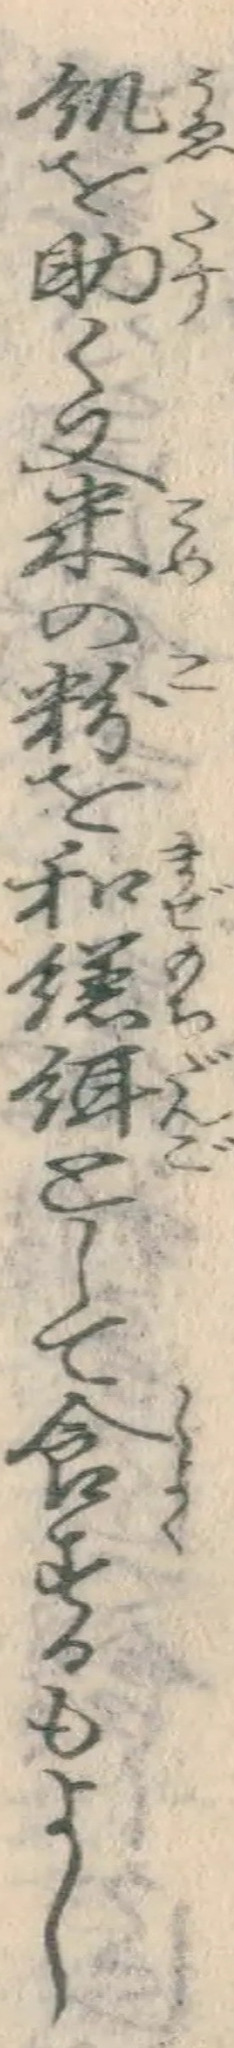飢を助く又米の粉を和餻餌として食するもよし
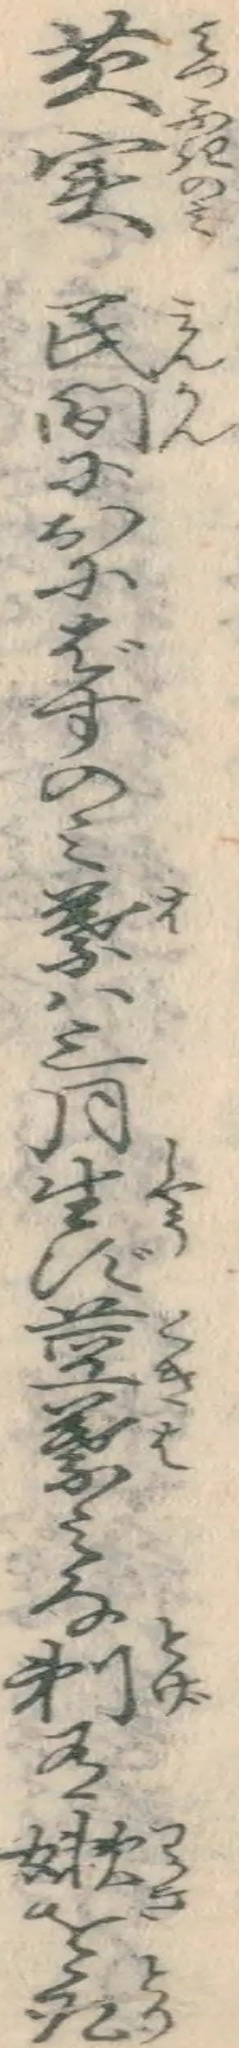黄実民間におにばすのみ葉は三月生ず茎葉みな剃有嫰を取
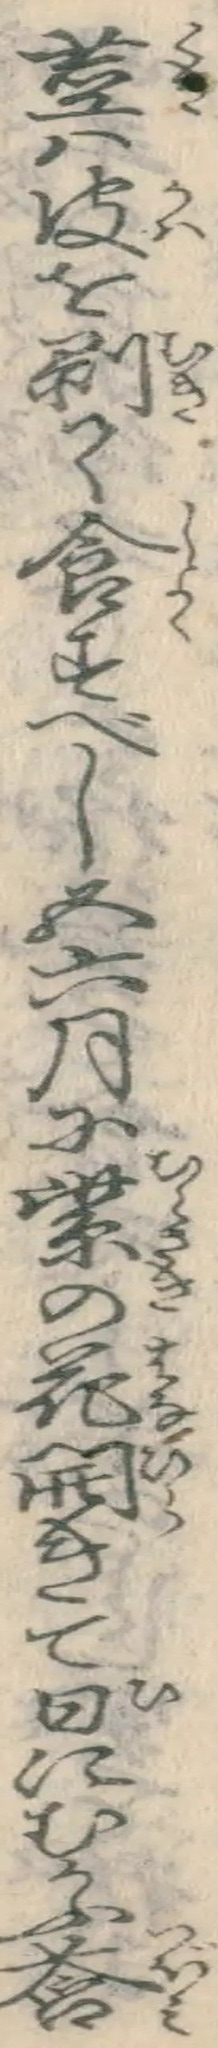茎は皮を剥て食すべし五六月に紫の花開きて日にむかふ莟
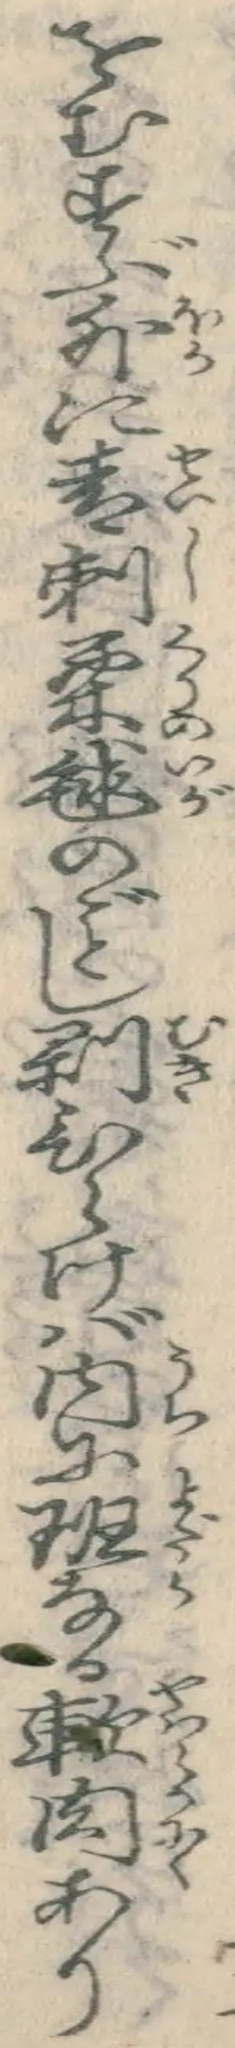をむすぶ外に青刺栗毬のごとし剥ひらけば内に班なる軟肉あり

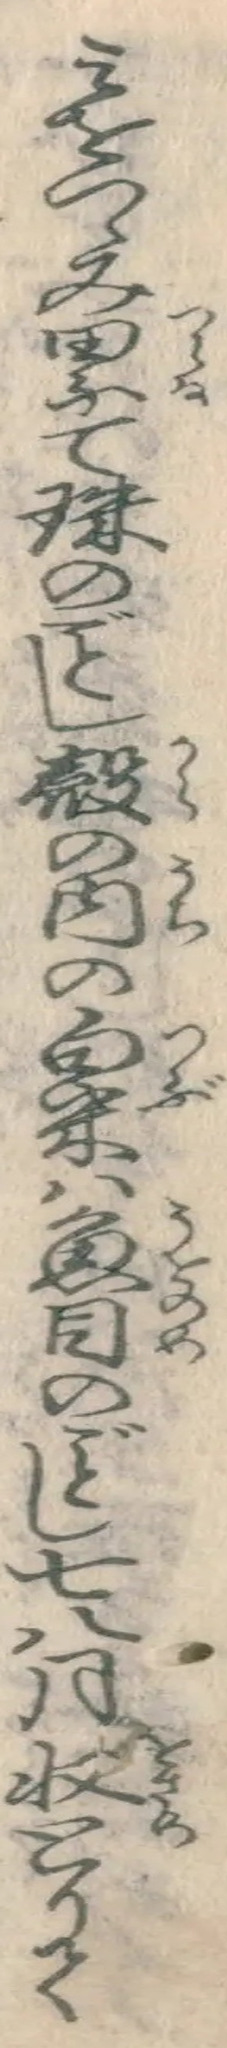みをつゝみ累て珠のごとし殻の内の白米は魚目のごとし七八月収とりて
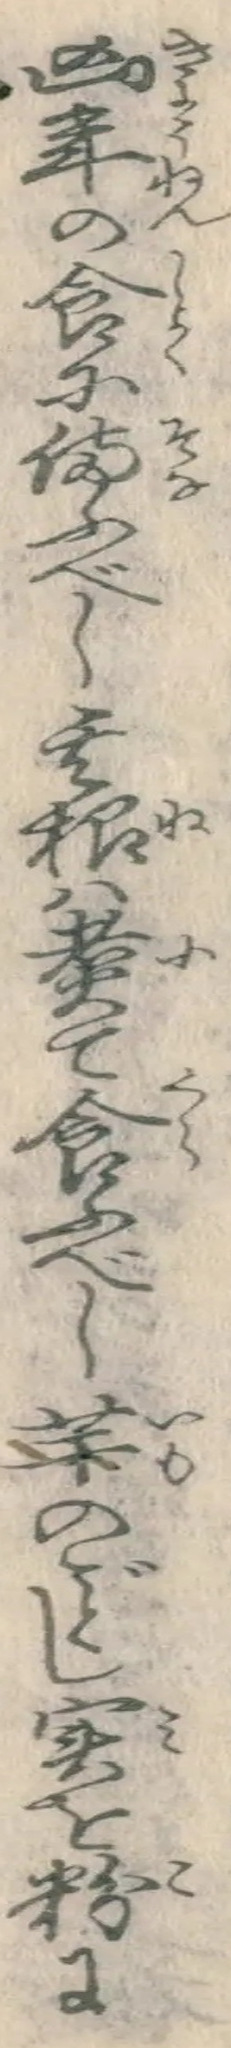凶年の食に備ふべし其根は煑て食ふふべし芋のごとし実を粉に
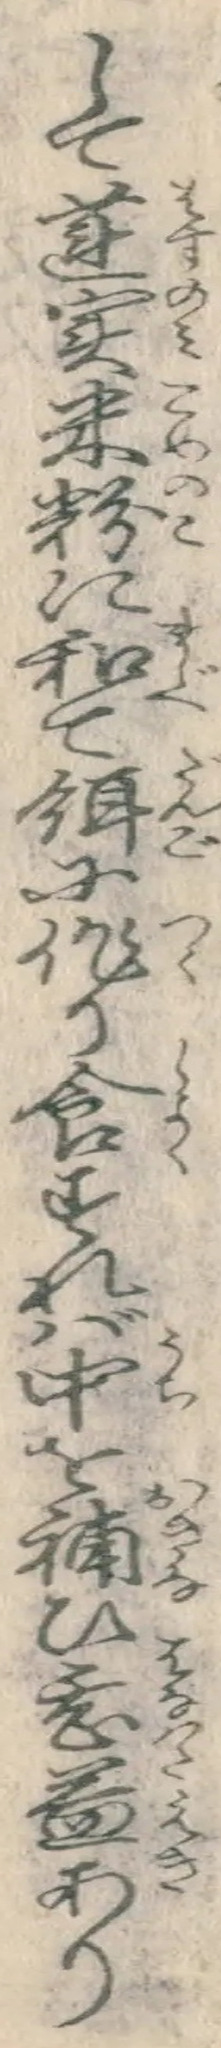して蓮実米粉に和て餌に作り食すれば中を補ひ甚益あり
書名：経済をしへ草
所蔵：国立国会図書館 National Diet Library, JAPAN
